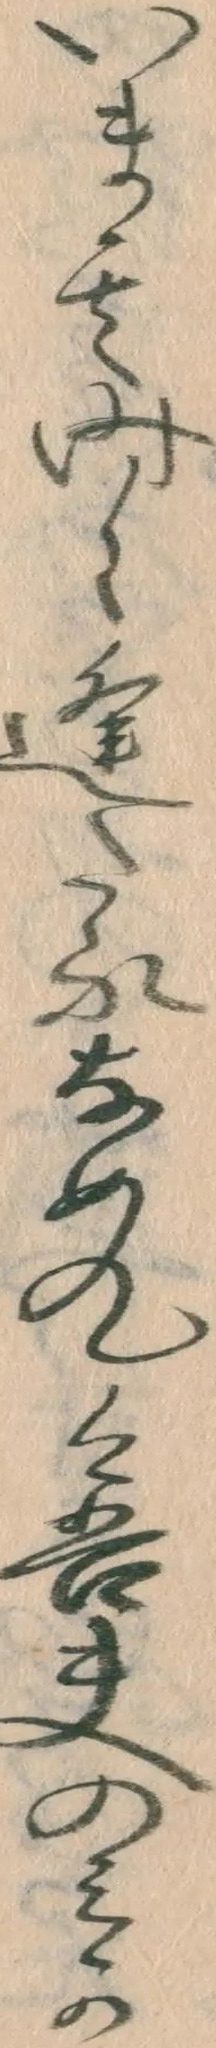いま其時に逢たるなめれは吾夫のミか
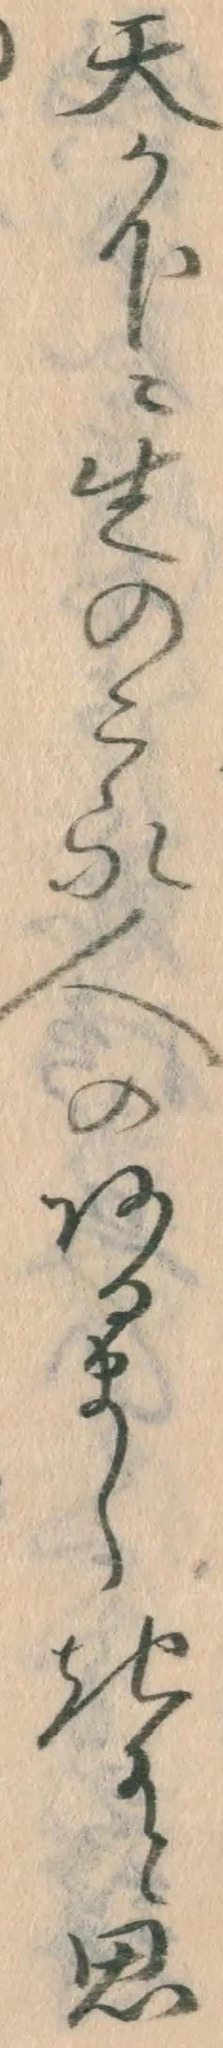天か下ニ生のこる人のあるましきよと思
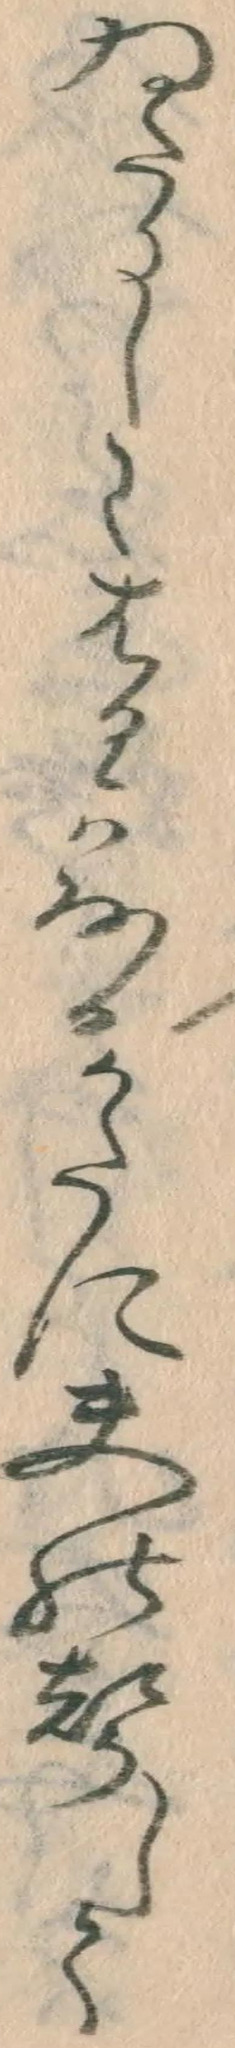ゐたりしにはるかなるかたに夫の聲して
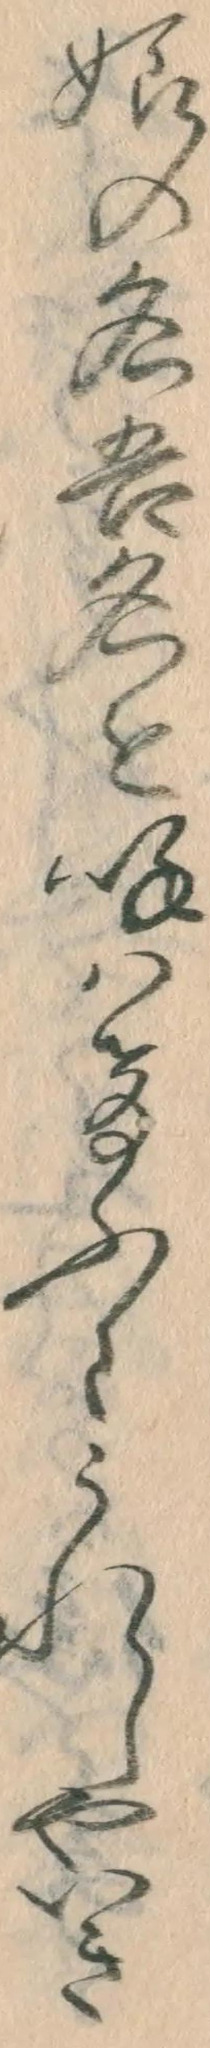娘の名吾名を呼ハせ玉ふにうれしやいき
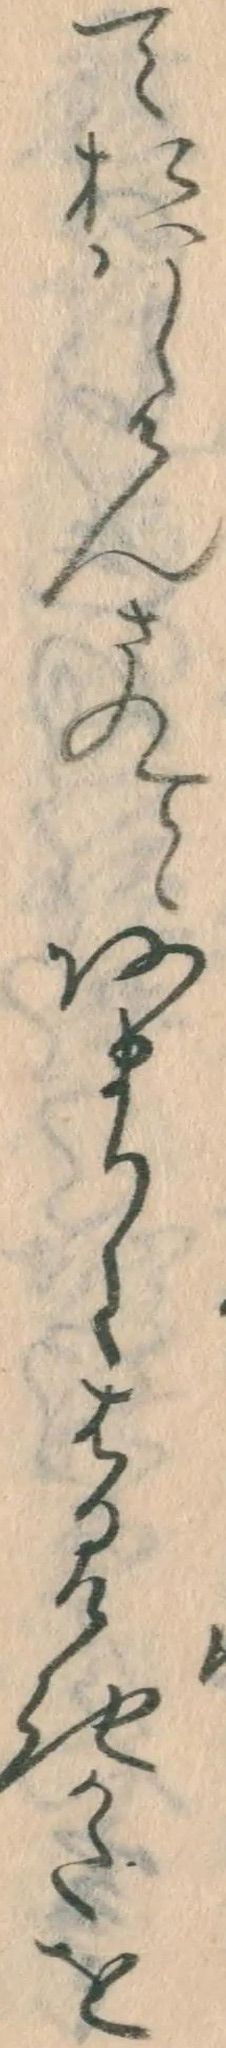ておハしけんされとあまりにはるけきかたを
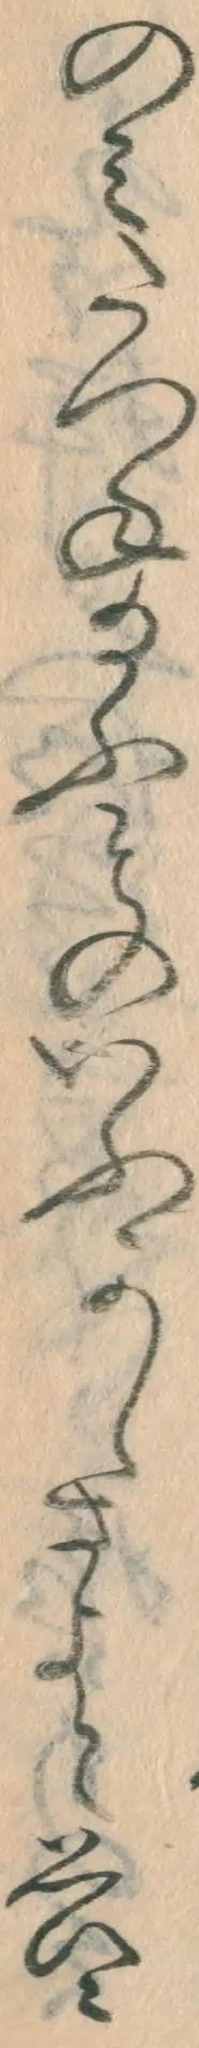のミたつね玉ふことのいふかしさよと思ひニ

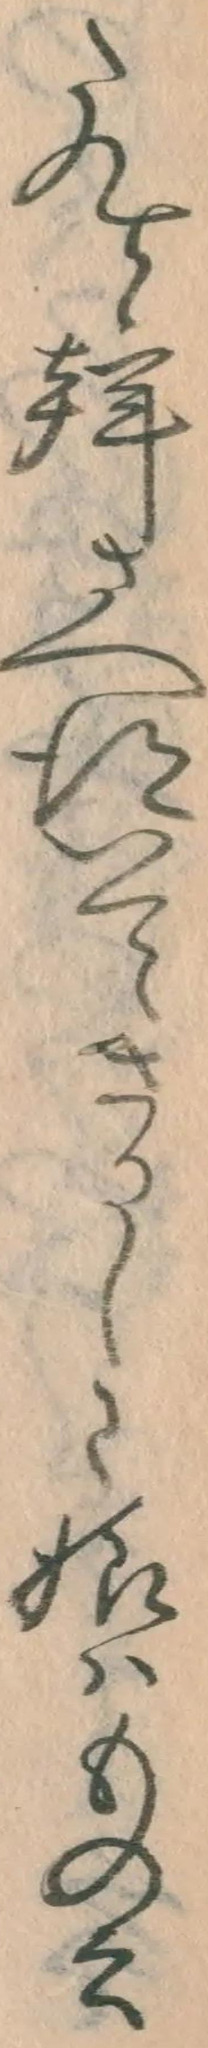たれは聲さへ得いてさりしに娘ハもの云
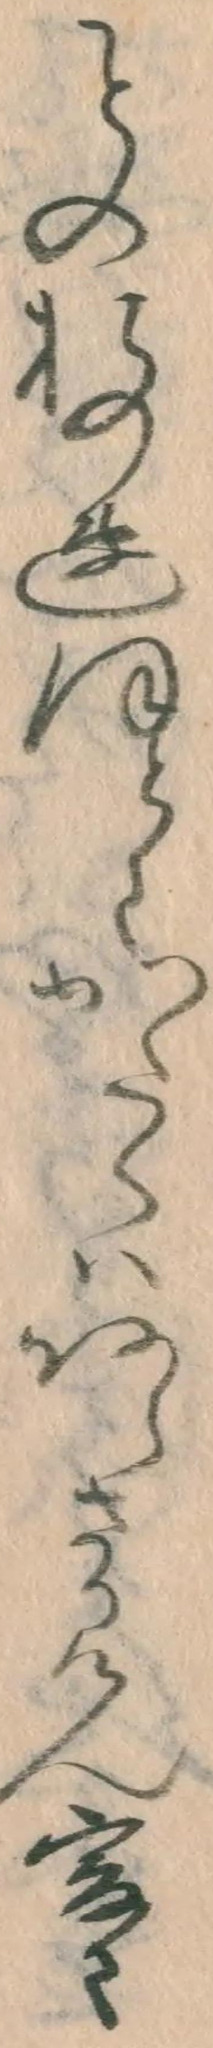ことのおのれほとにかたくハあらさりけん爰に
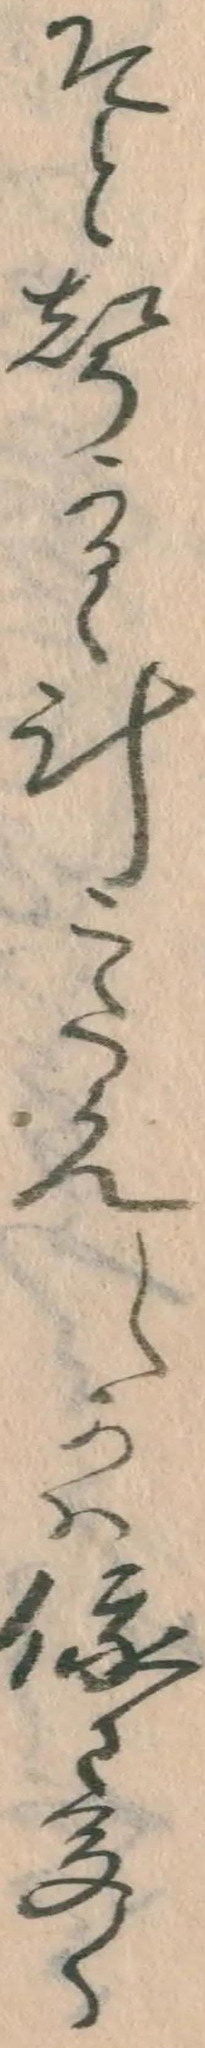そと聲かるゝ計こたえしかハ俄に多く
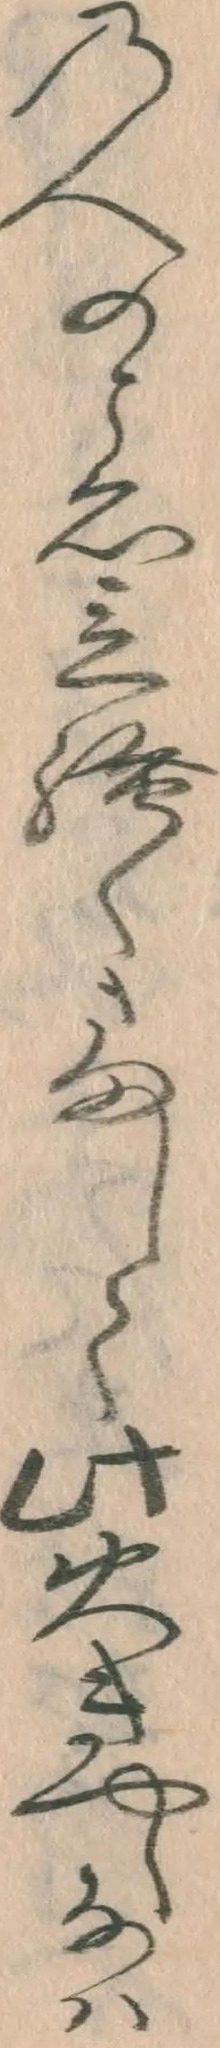の人のこゑ立騒くさまして此火きやしなハ
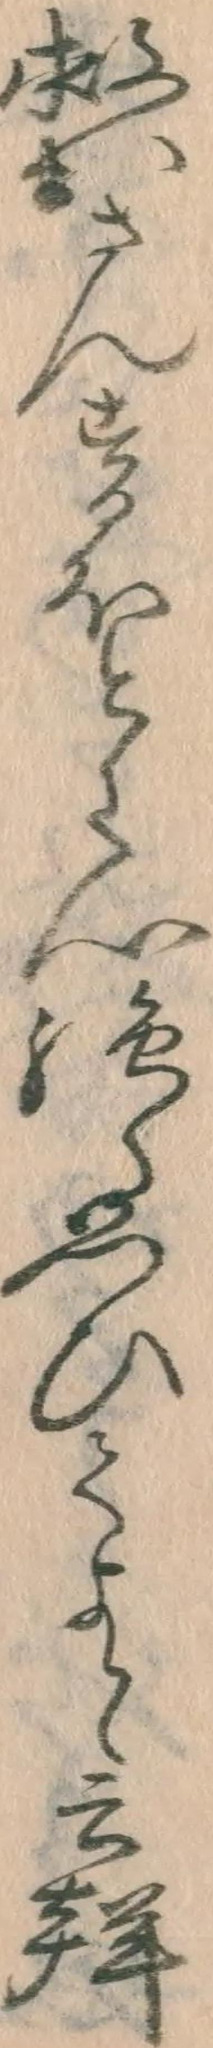救出さんするほとに心強く思ひてよと云聲
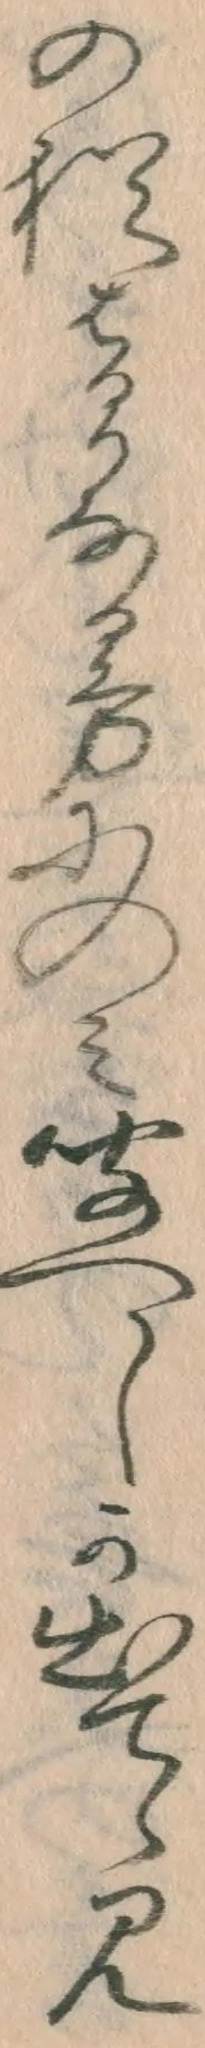の猶はるかなる方にのミ聞へしか出てゝ見
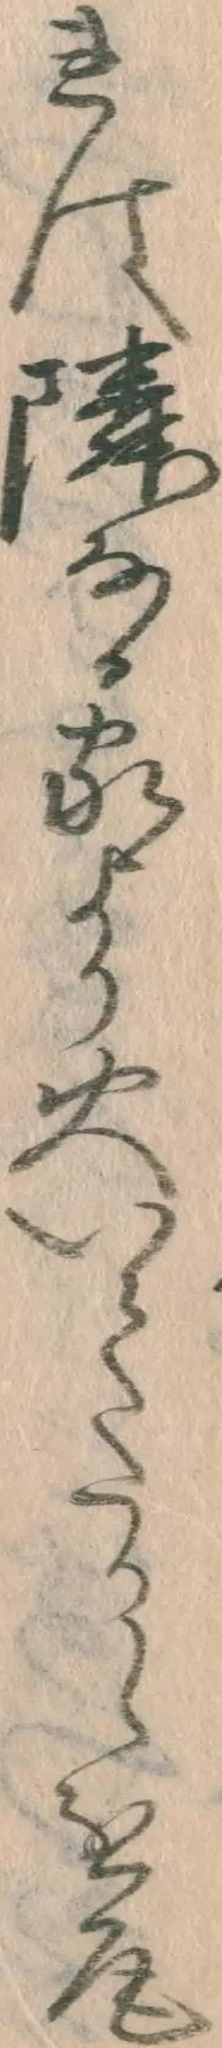れは隣なる家より火いてたりしを瓦
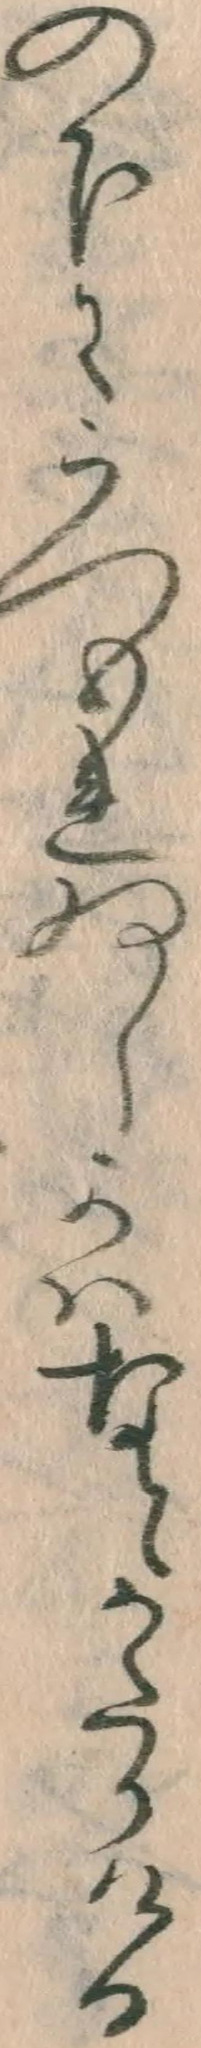の下にうつもれゐしかハなとかたりける
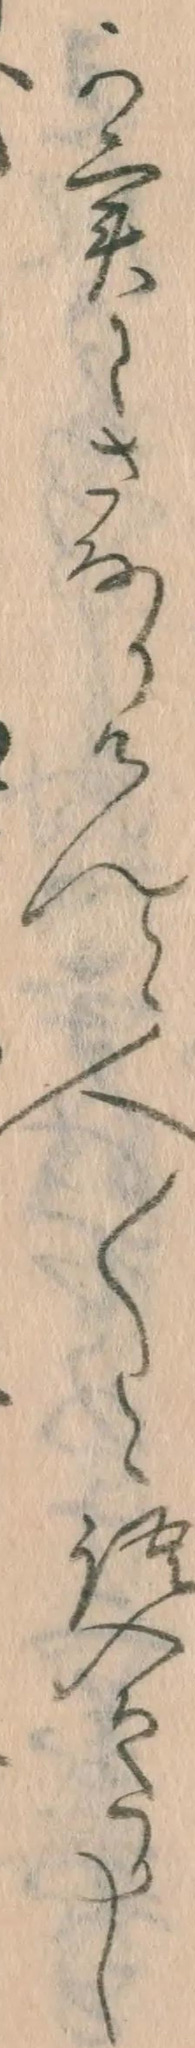か実にさなりけんと人〳〵と語合たりし
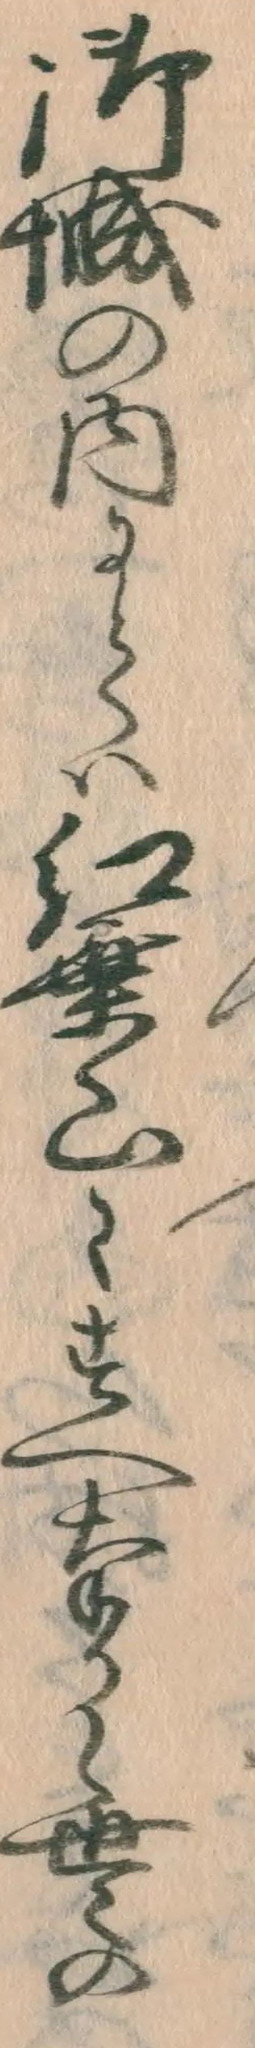御城の内にてハ紅葉山にすへ奉りし世々の
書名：麗斎叢書. 20
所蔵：国立国会図書館 National Diet Library, JAPAN
